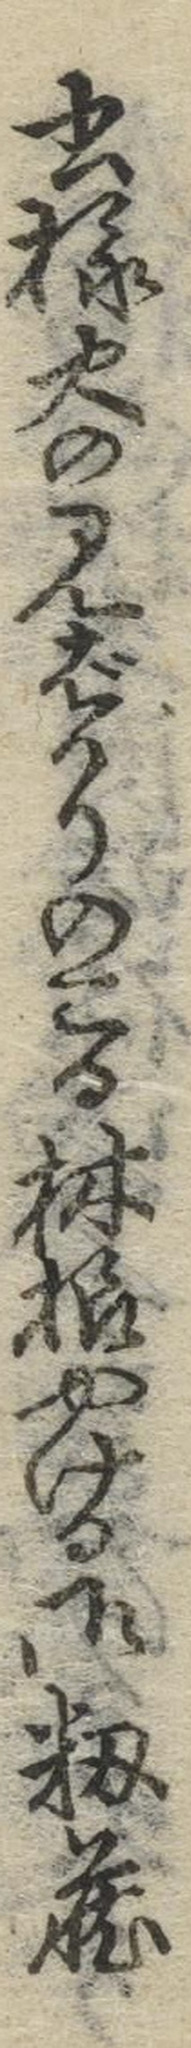書様火の見ばかりのこる林様やける御籾蔵
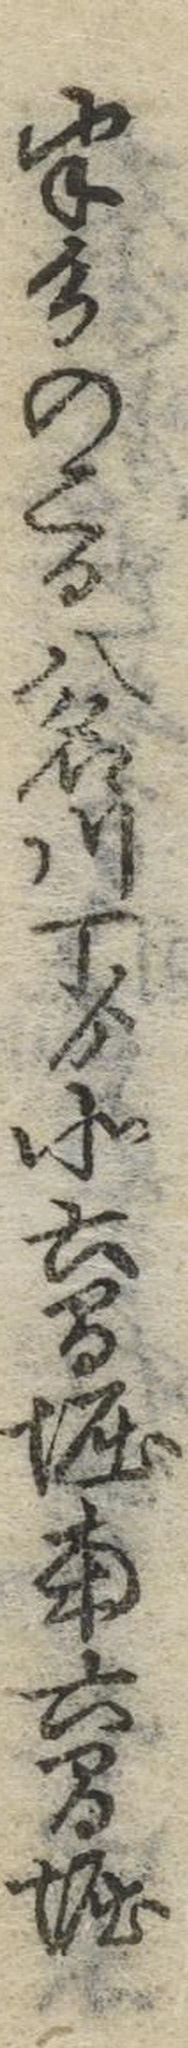半分のこる八名川丁ゟ北六間堀南六間堀
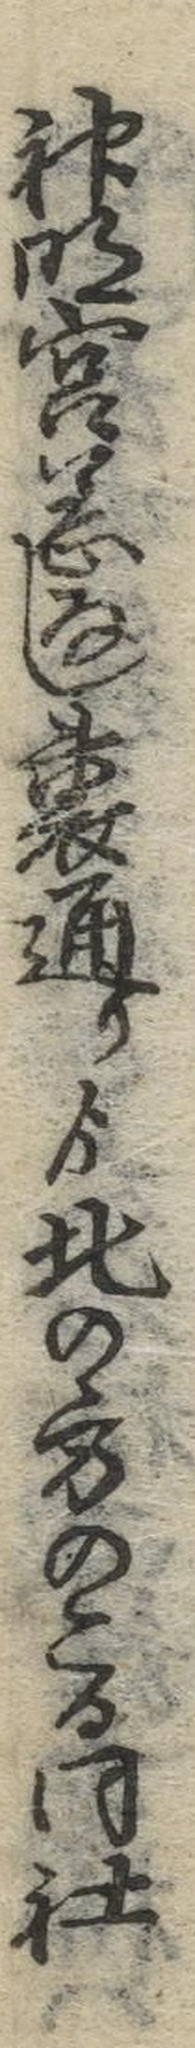神明宮恙なし裏通りゟ北の方のこる同社
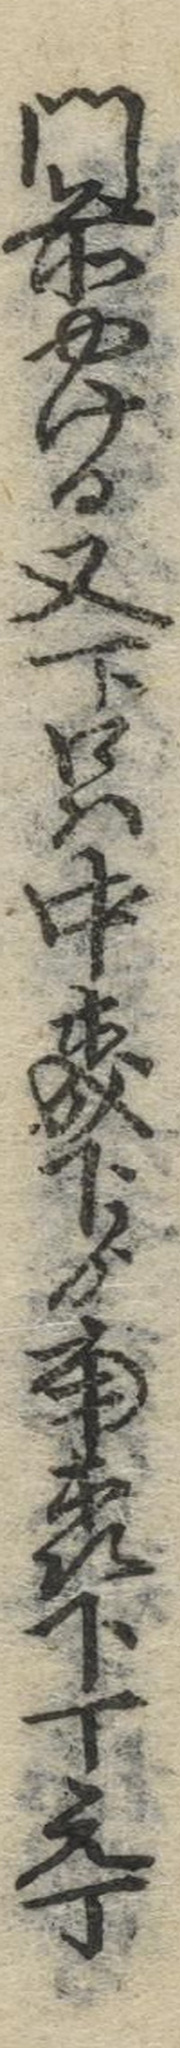門前やける又一ト口ハ中森下ゟ南森下丁元丁
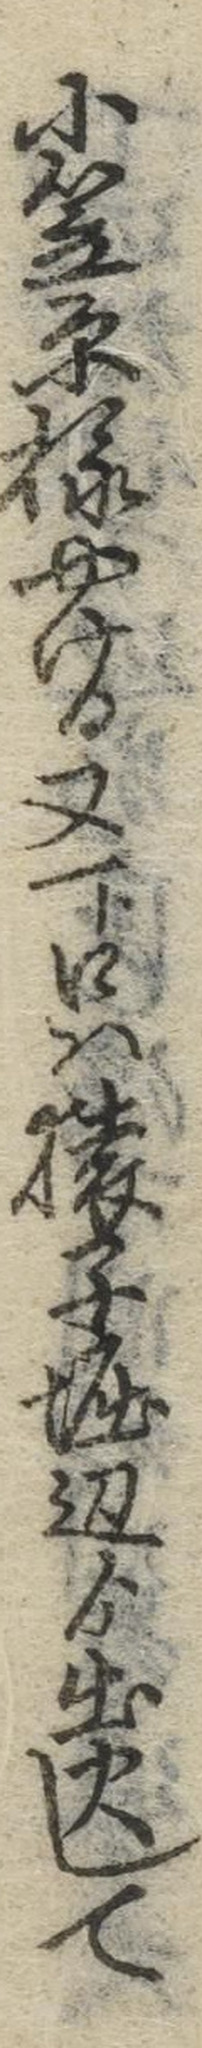小笠原様やける又一ト口ハ猿子堀辺ゟ出火して
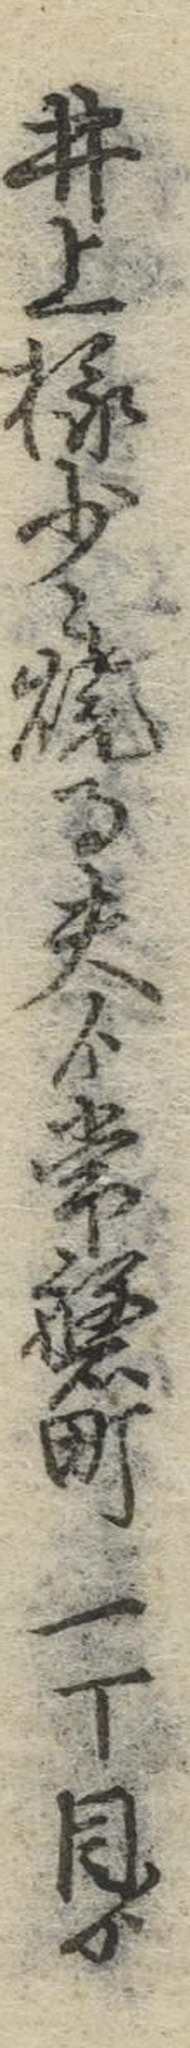井上様少〻焼る夫ゟ常磐町一丁目ゟ
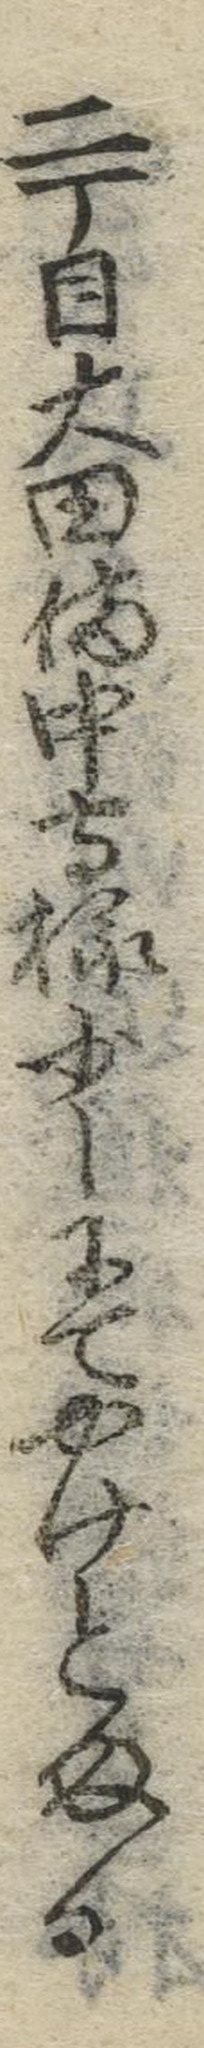二丁目大田備中守様少しにてやけとまる
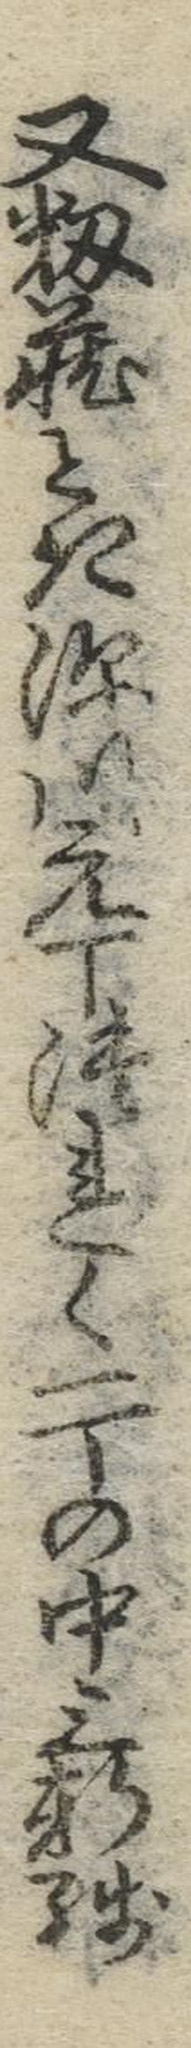又籾蔵わき深川元丁潰れく一丁の中三軒残
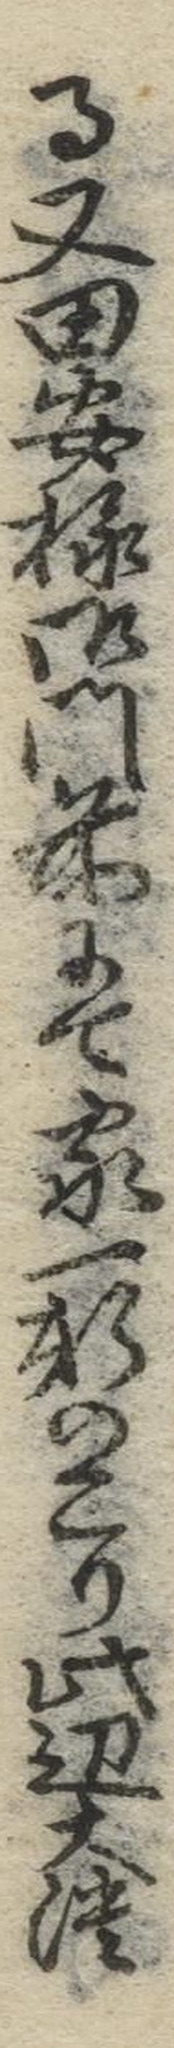る又田安様御門前にて家一軒のこり此辺大潰
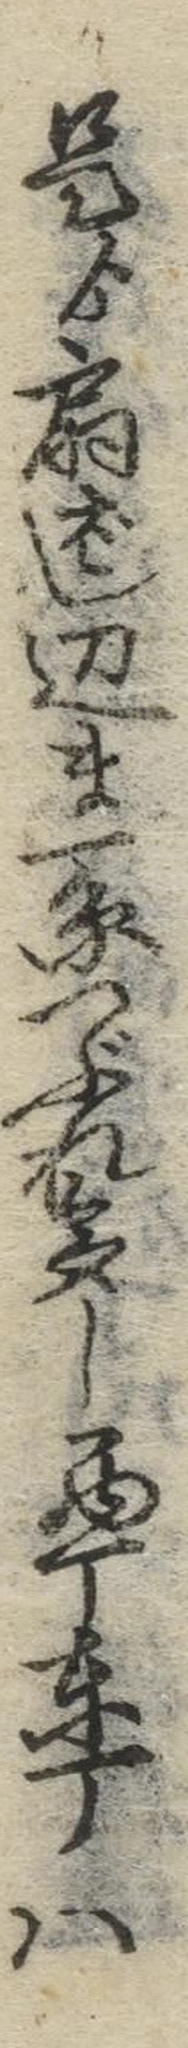是ゟ扇ばし辺ま一円つぶれ多し西丁東丁ハ
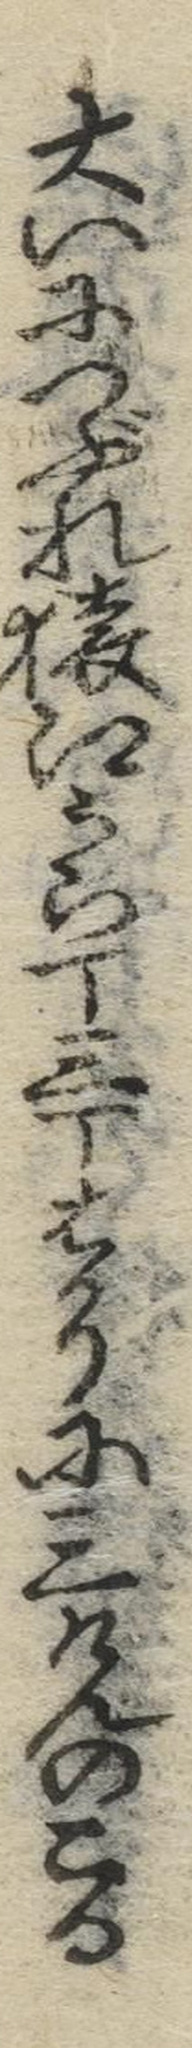大いにつぶれ猿江うら丁三丁はかりに三けんのこる
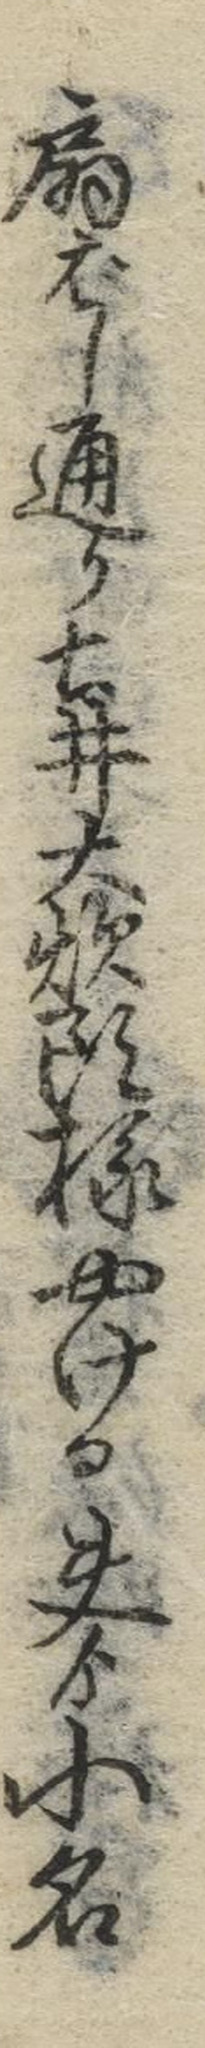扇ばし通り土井大炊頭様やける夫ゟ小名
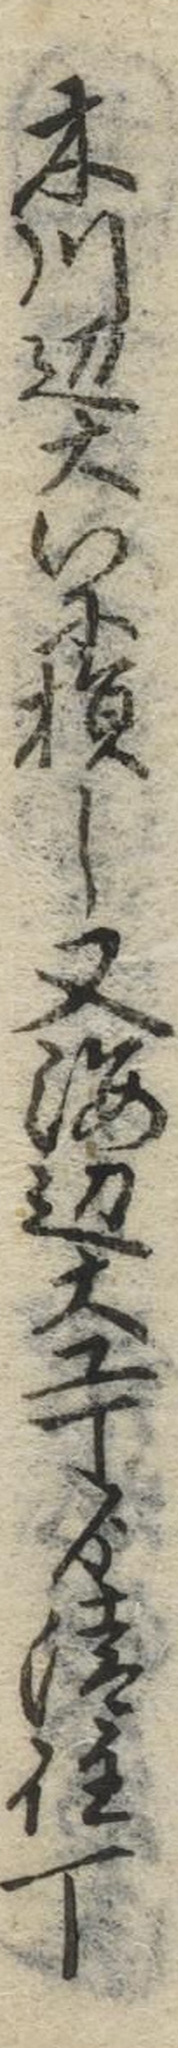木川辺大いに損し又海辺大工丁ゟ清住丁
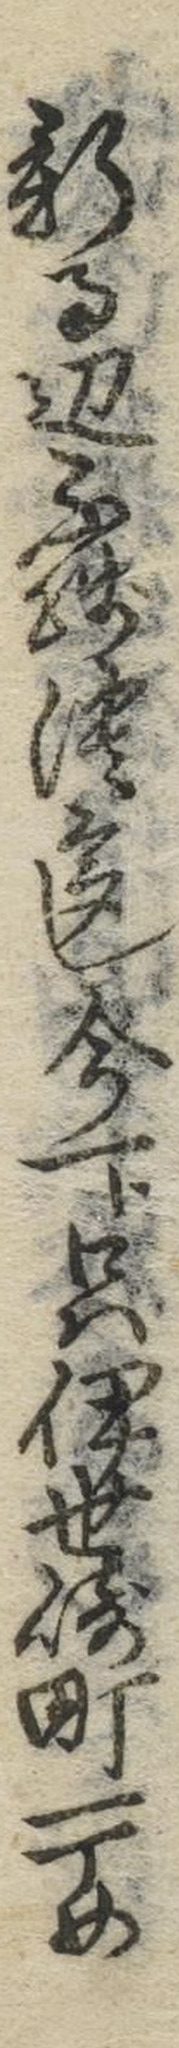新馬辺不残潰多し今一ト口ハ伊世崎町一丁め

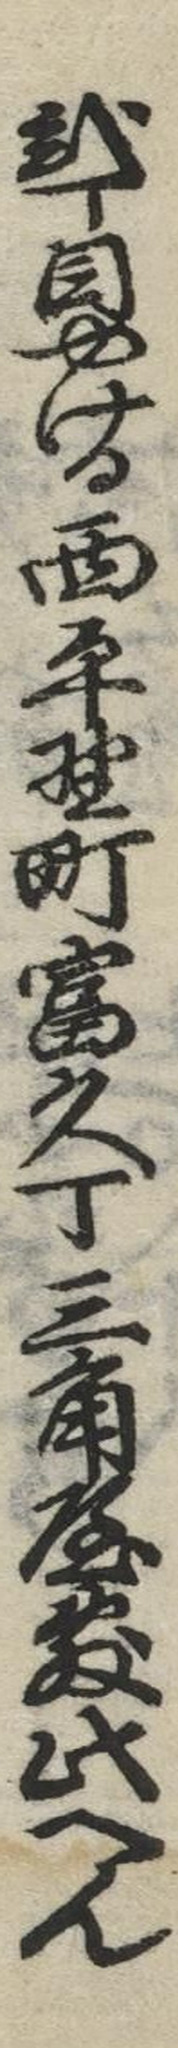弐丁目やける西平野町富久丁三角屋敷此へん
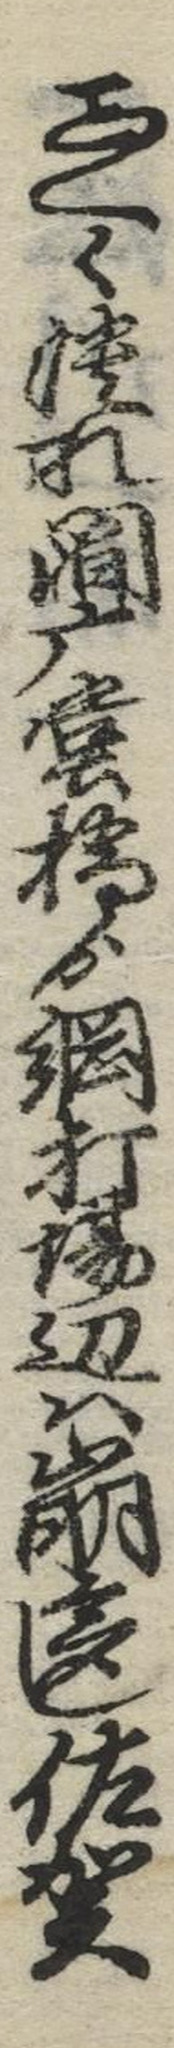こと〳〵く潰れ閻魔堂橋ゟ網打場辺ハ崩多し佐賀
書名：江戸御屋鋪方町方共　地震類焼場所巨細書之寫　潰家潰土蔵共取調附街道筋近在迄
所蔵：東京大学地震研究所図書室 Earthquake Research Institute Library, The University of Tokyo, JAPAN
